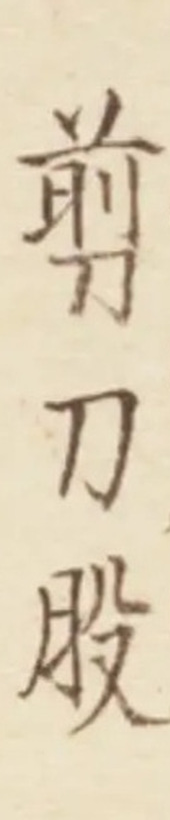剪刀股
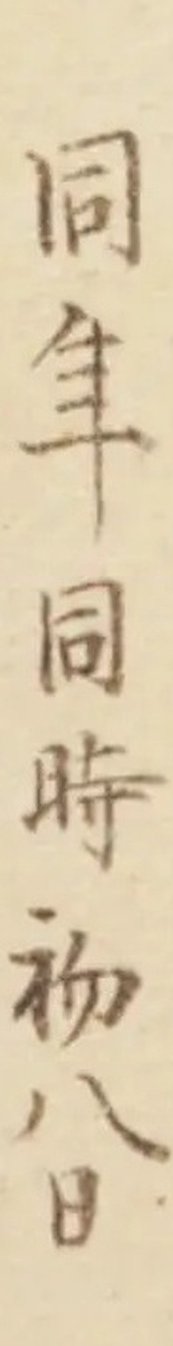同年同時初八日
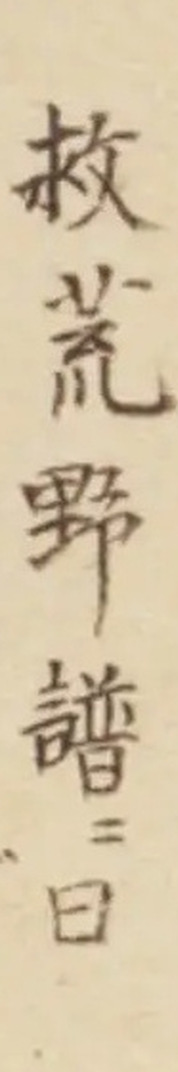救荒野譜曰
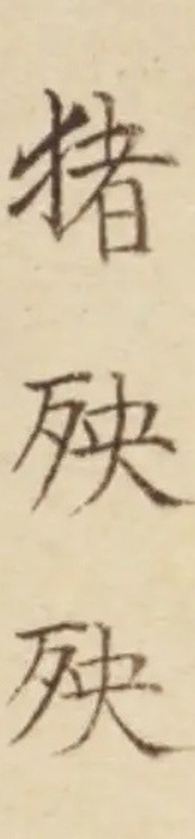猪殃殃
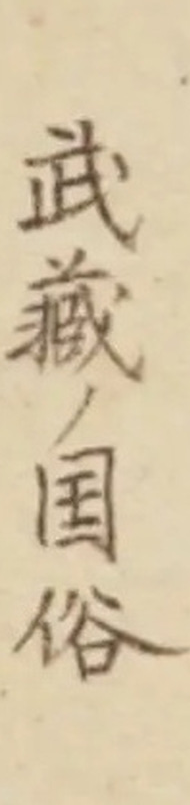武蔵の国俗
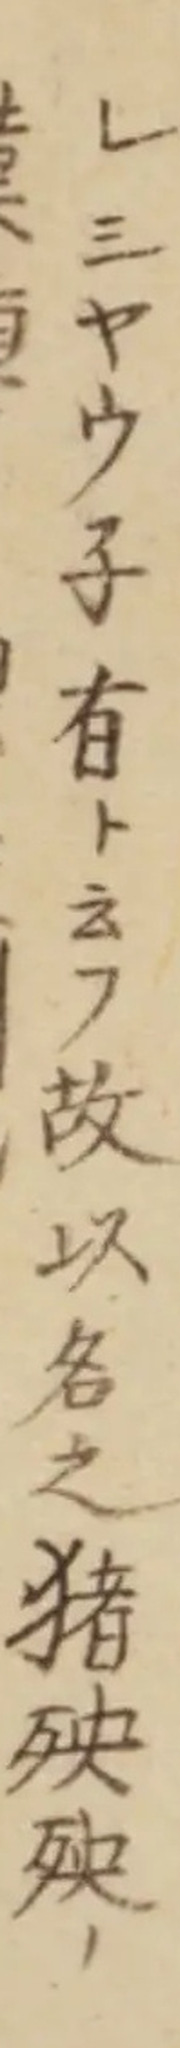れしやう子有と云ふ故以て名之猪殃殃の

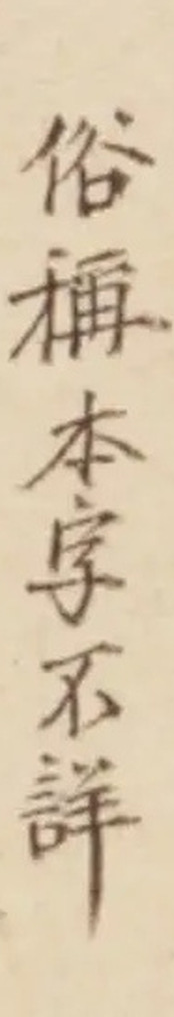知草俗稱本字不詳
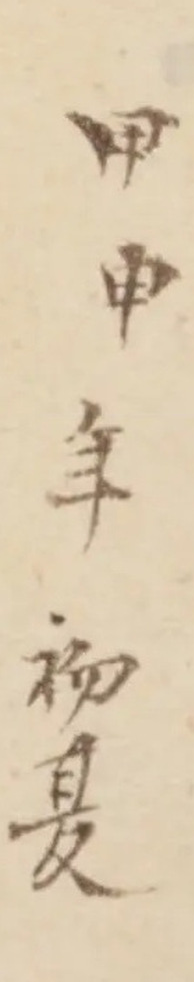甲申年初夏
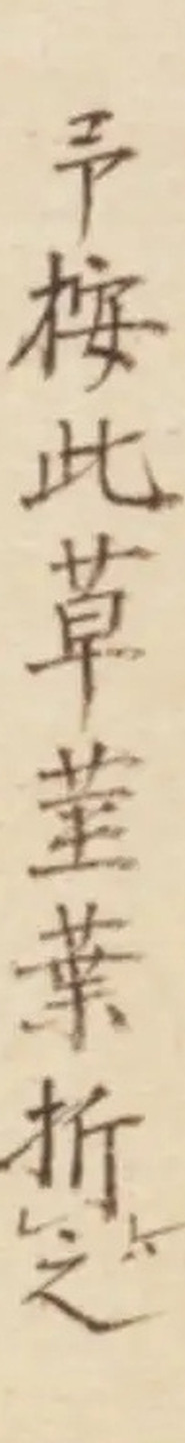予按此の草莖葉折れは之
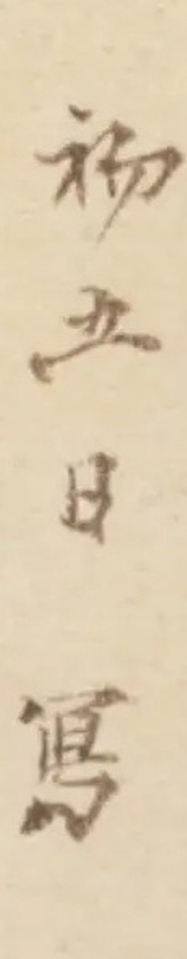初五日寫
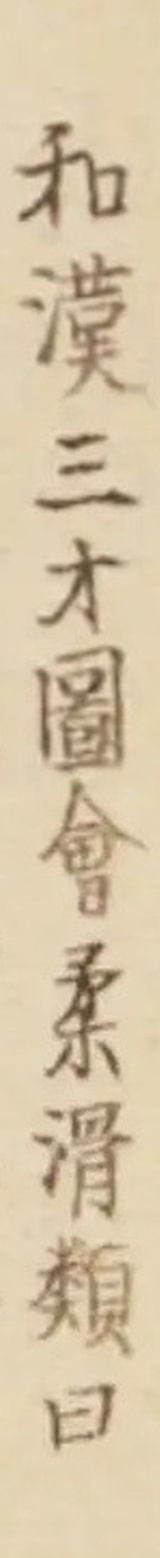和漢三才圖會柔滑類ニ曰
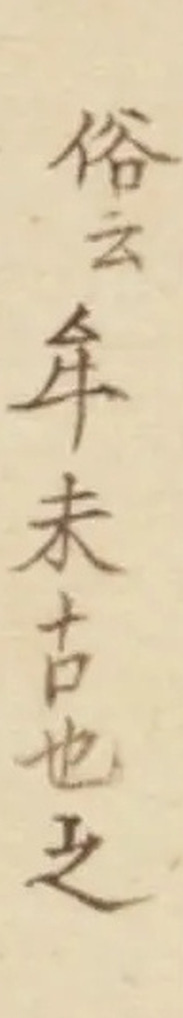俗云う牟未古也之
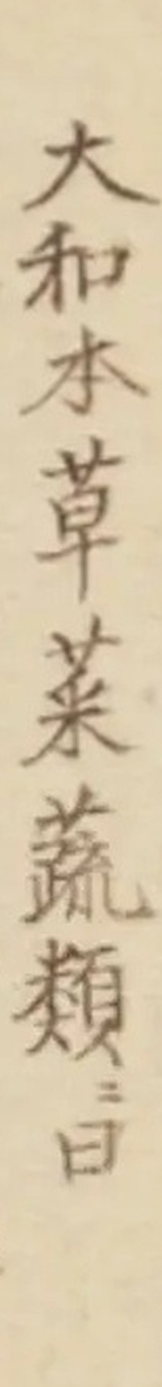大和本草菜類ニ曰
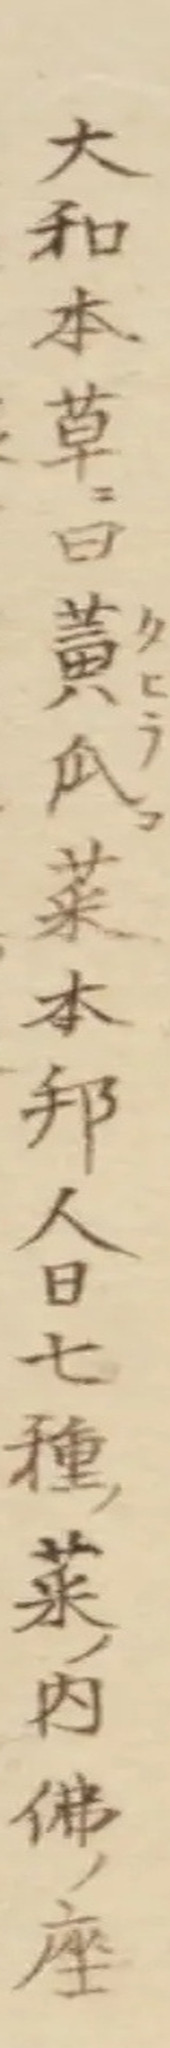大和本草に曰黄瓜菜本邦人日七種の内佛の座
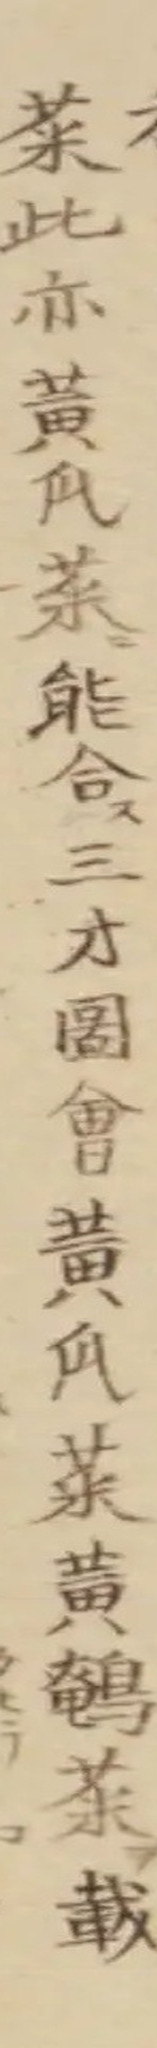菜此れ亦黄瓜菜に能合す三才圖會黄瓜菜黄鵪菜を載す

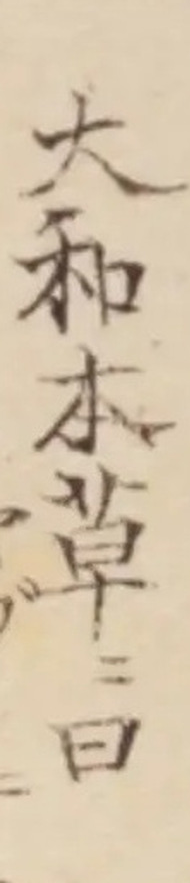大和本草ニ曰
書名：梅園草木花譜夏之部. 2
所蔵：国立国会図書館 National Diet Library, JAPAN
